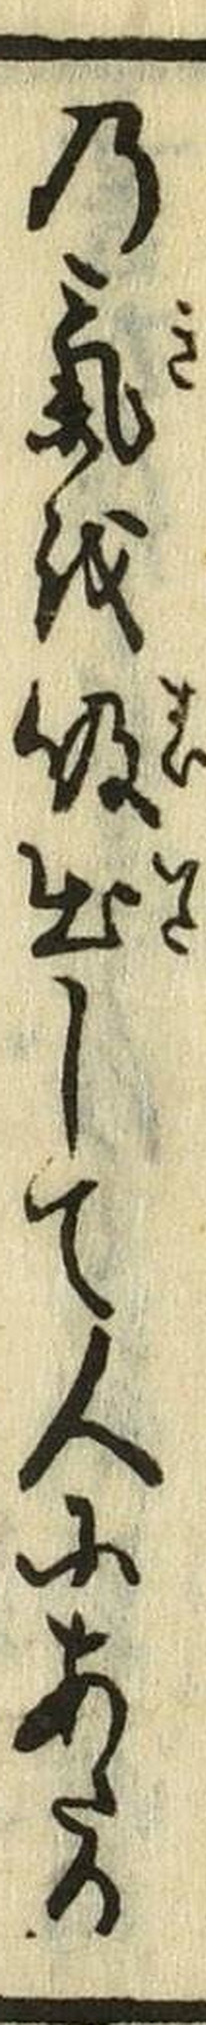の気を吸出して人にあたる
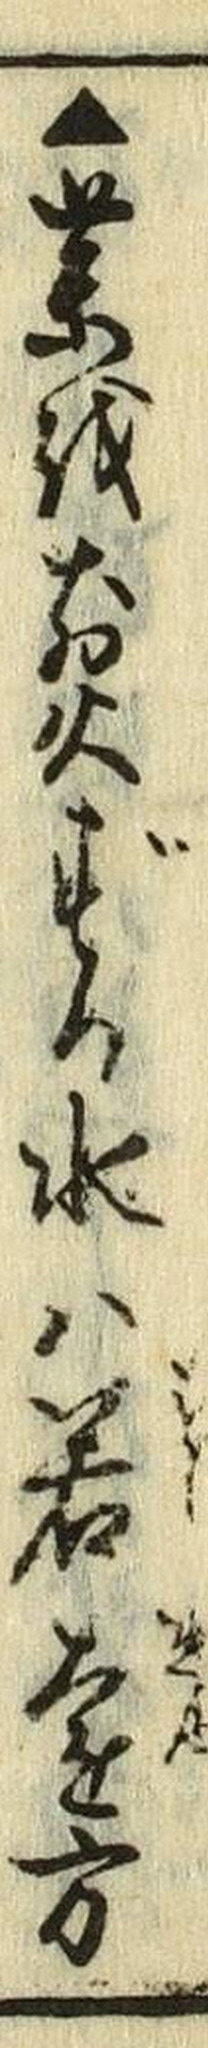▲薬を煎ずる水は若遠方
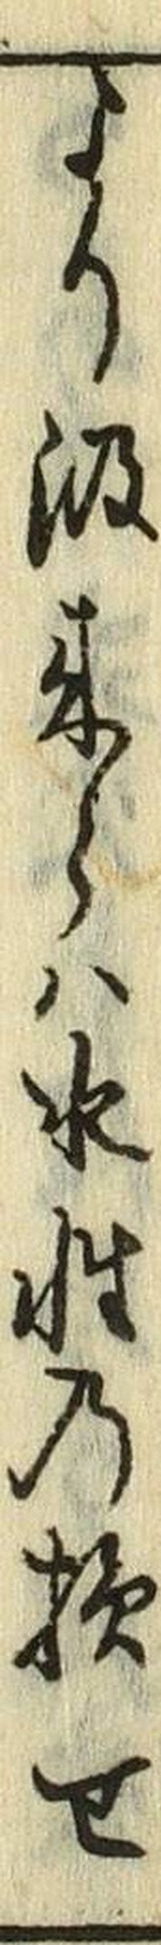より汲来らは水性の損ぜ
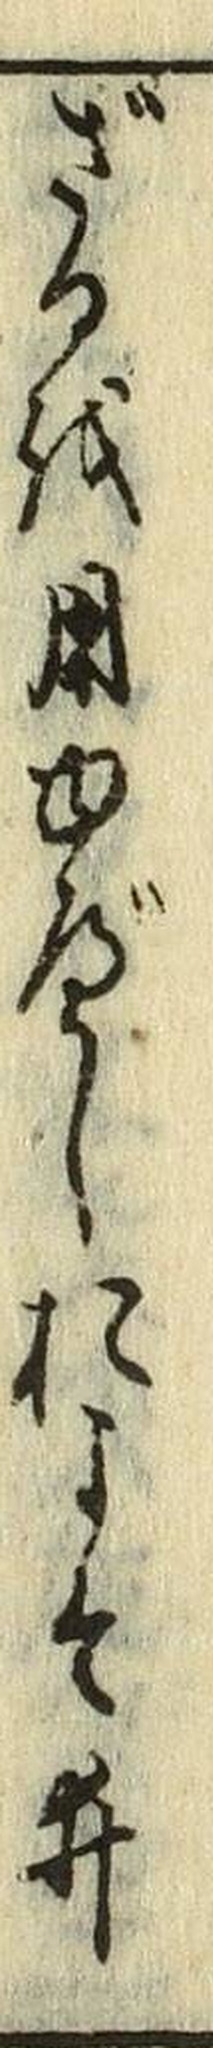ざるを用ゆべしおよそ井
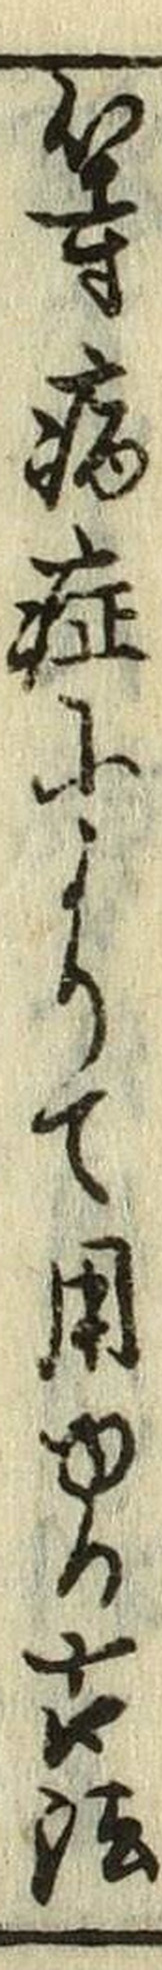等病症によりて用ゆる古法
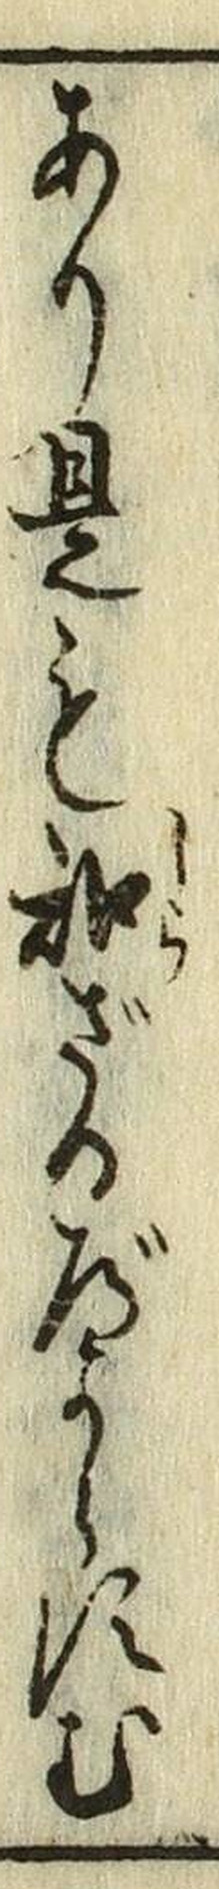あり是も知ざるべからすむ
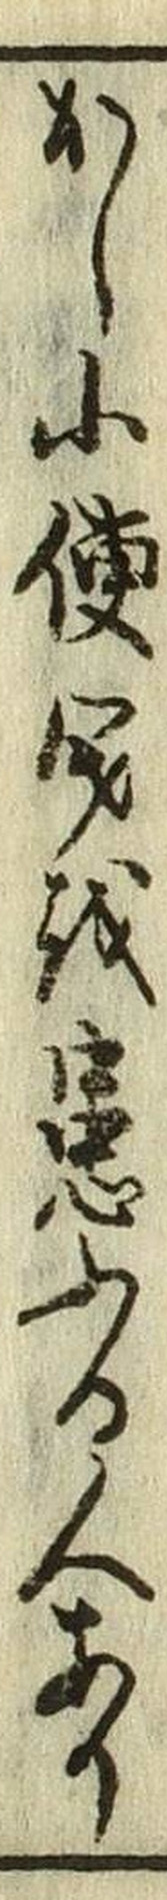かし小便閉を患ふる人あり
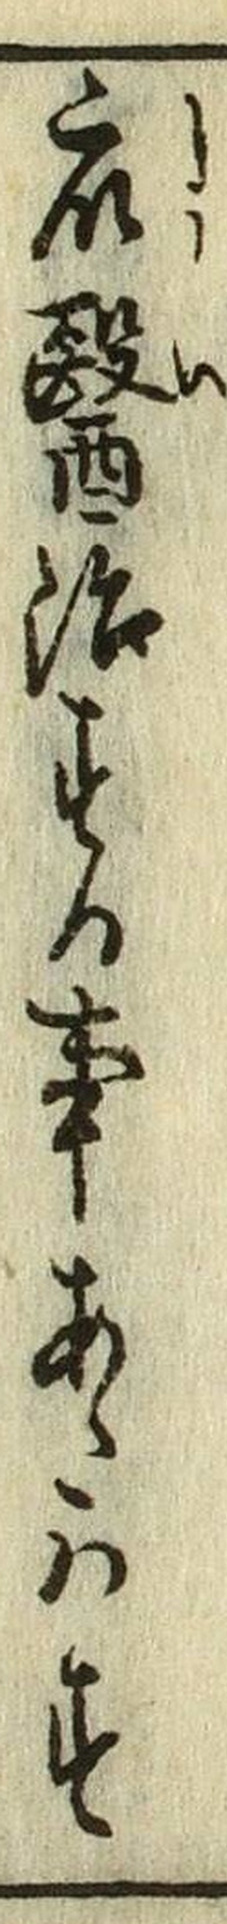衆医治する事あたはす
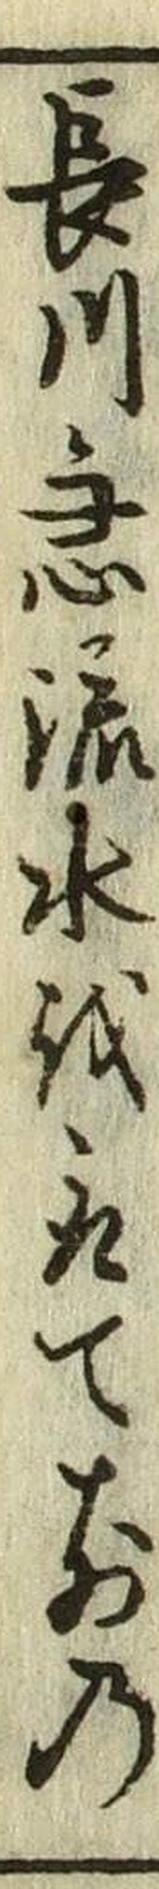長川急流水を取て前の
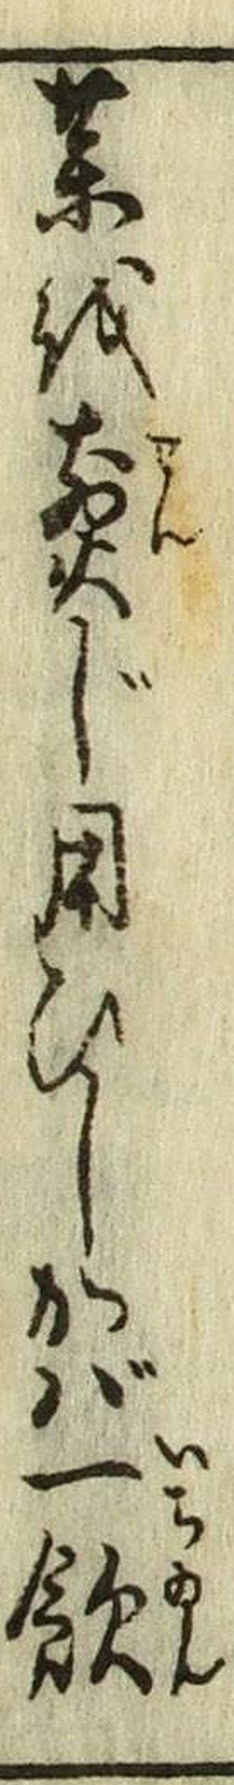薬を煎じ用ひしかば一飲
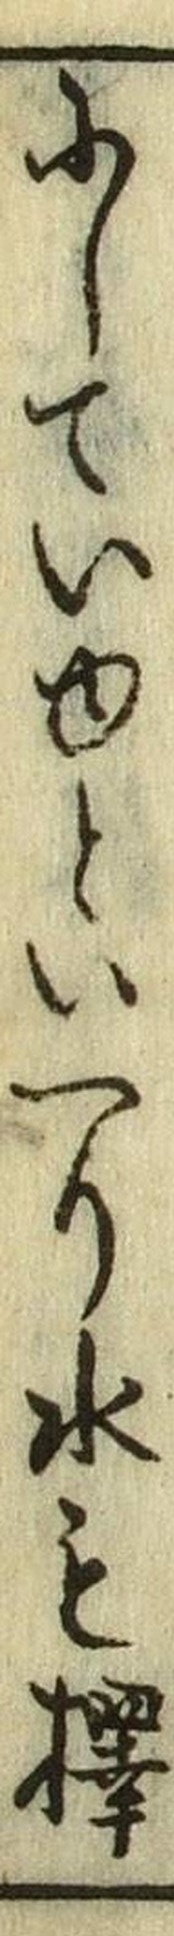にしていゆといへり水も択

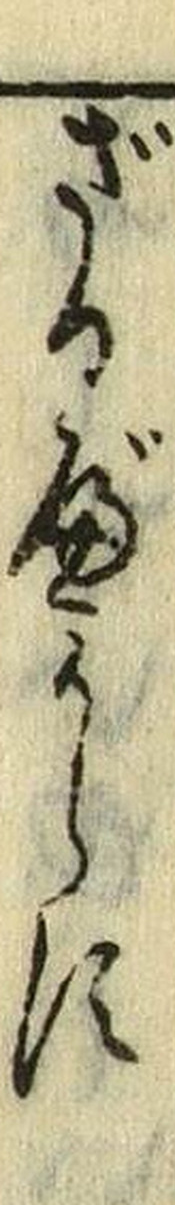ざるべからす
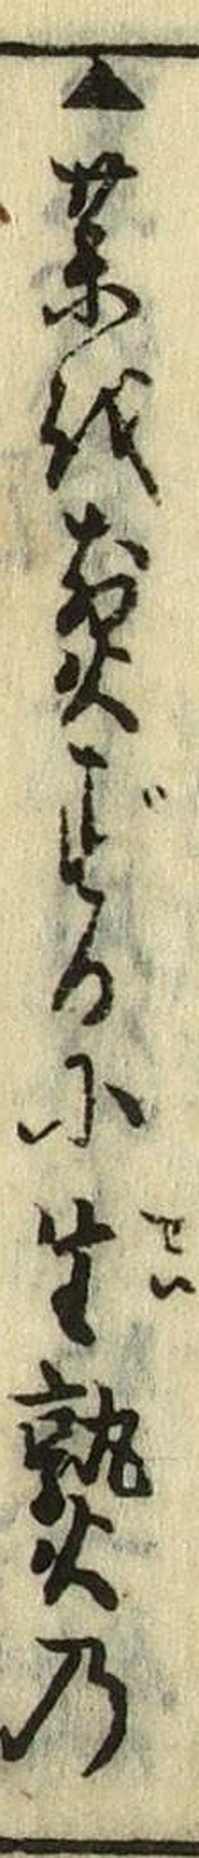▲薬を煎ずるに生熟の
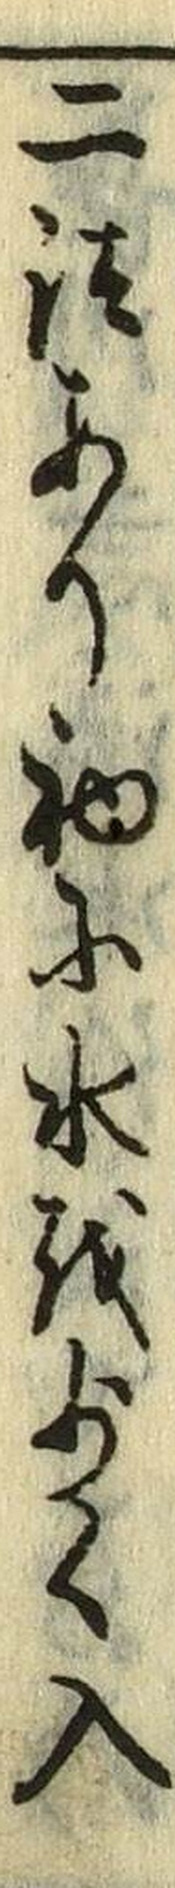二法あり初に水を少く入
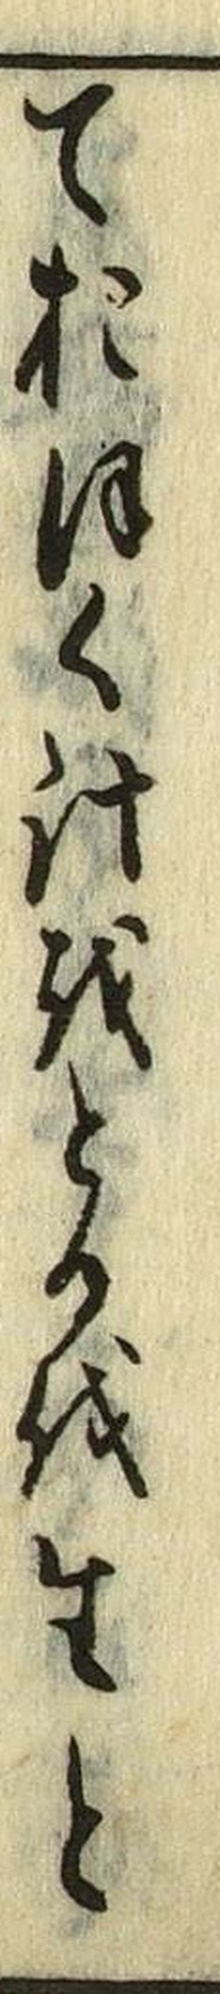ておほく汁をとるを生と
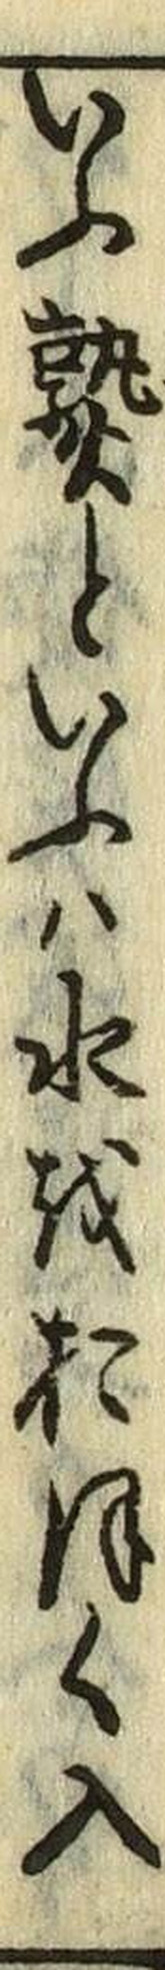いふ熟といふは水をおほく入
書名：居家養生記
